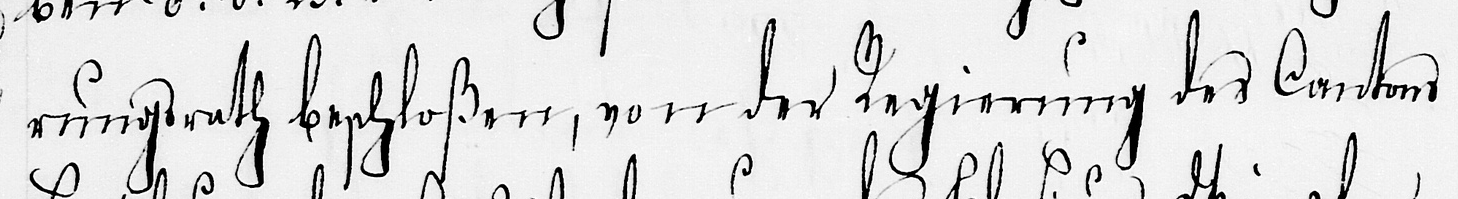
rungsrath beschloßen, von der Regierung des Cantons
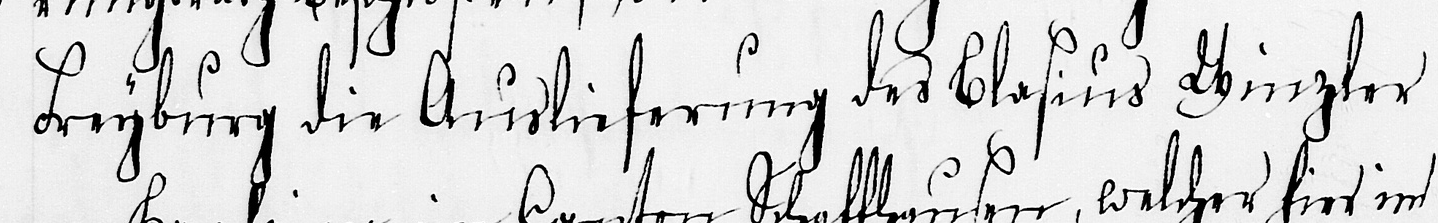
Freyburg die Auslieferung des Blasius Winzler
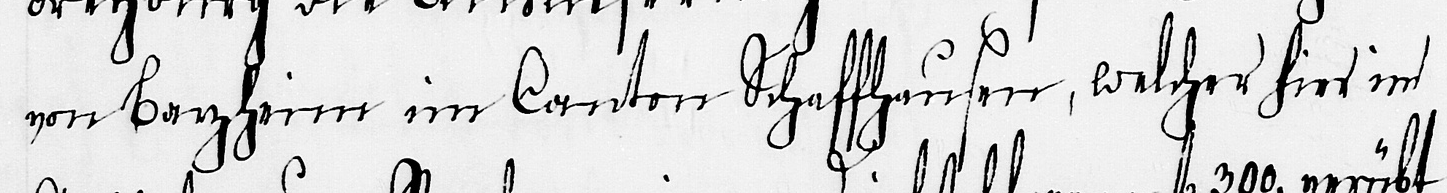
von Barzheim im Canton Schaffhausen, welcher hier im
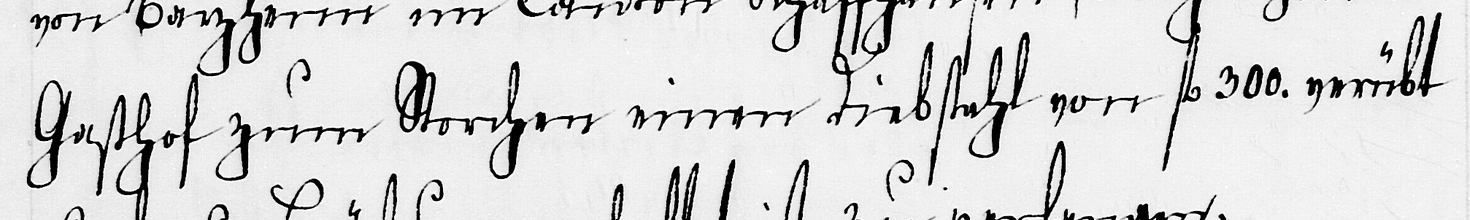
Gasthof zum Storchen einen Diebstahl von fl 300. verübt
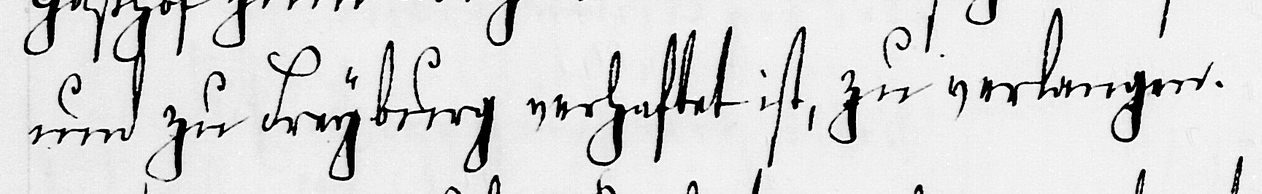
und zu Freyburg verhaftet ist, zu verlangen.
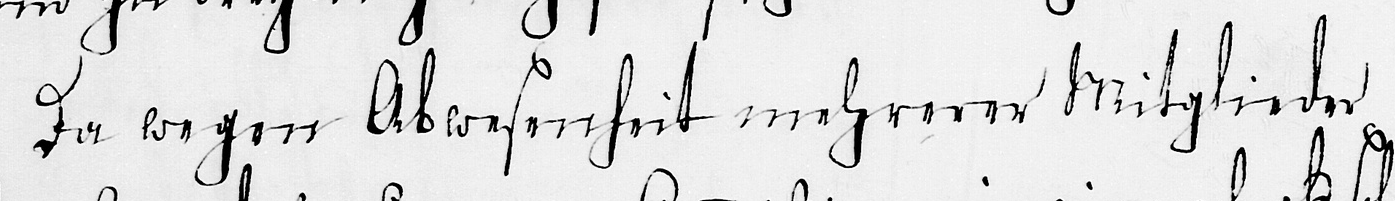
Da wegen Abwesenheit mehrerer Mitglieder
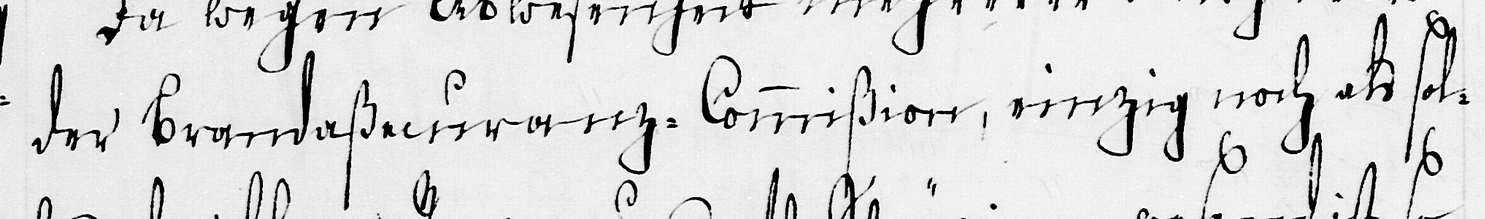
der Brandaßecuranz-Commißion, einzig noch als sol¬
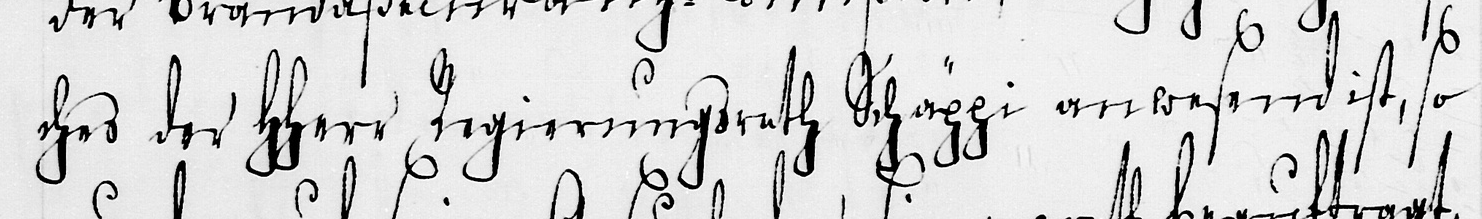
ches der HHerr Regierungsrath Schäppi anwesend ist, so
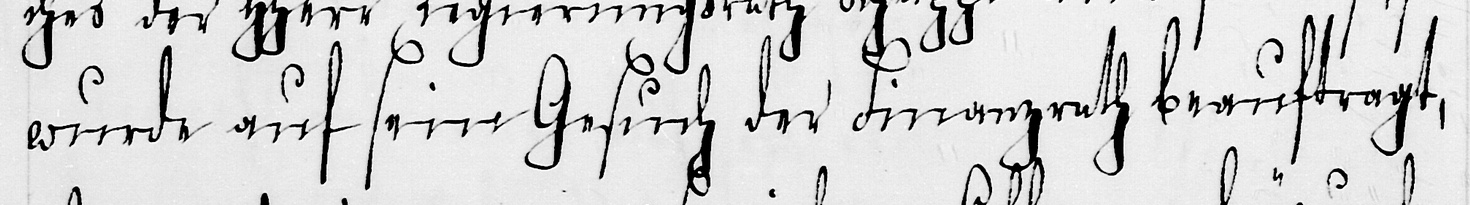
wurde auf sein Gesuch der Finanzrath beauftragt,
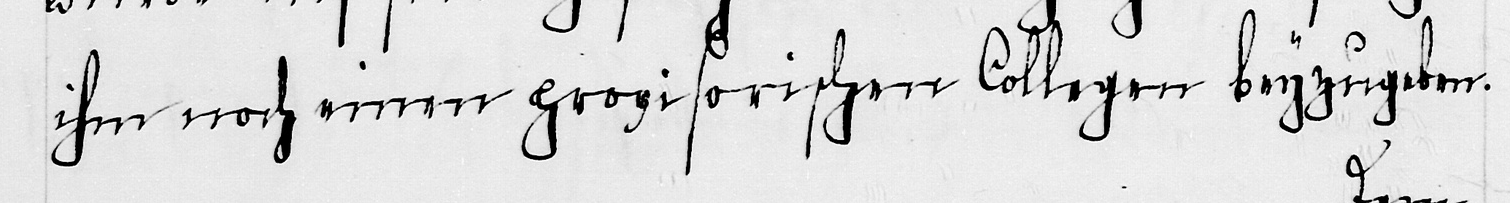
ihm noch einen provisorischen Collegen beyzugeben.
